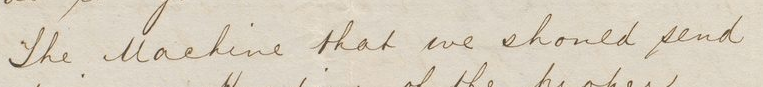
The Machine that we should send
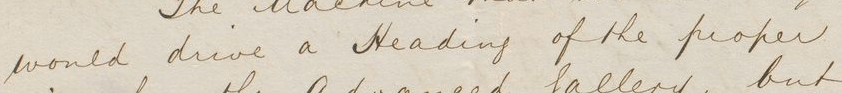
would drive a Heading of the proper
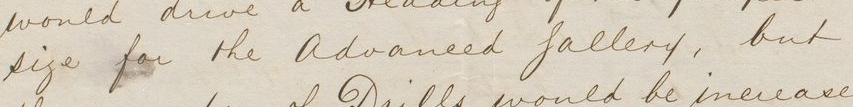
size for the Advanced Gallery, but
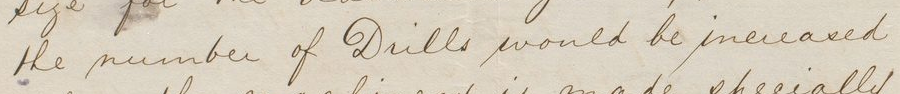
the number of Drills would be increased
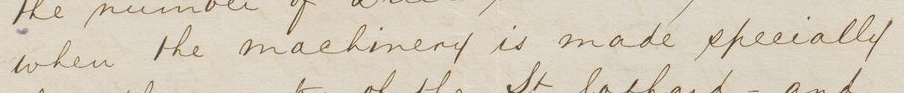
when the machinery is made specially
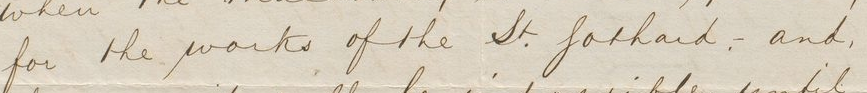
for the works of the St. Gothard. – and,
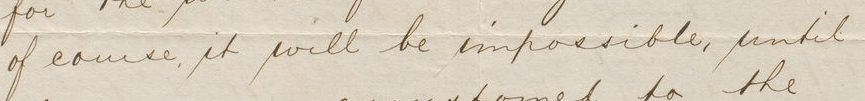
of course, it will be impossible, until
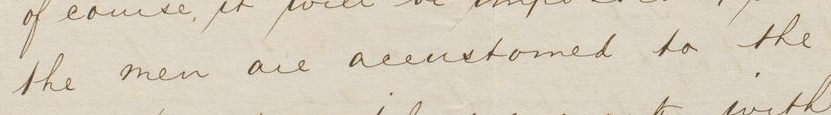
the men are accustomed to the
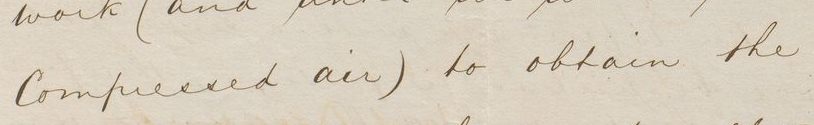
Compressed air) to obtain the
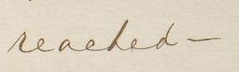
reached –
